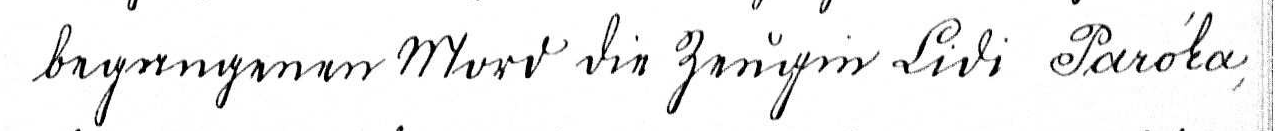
begangenen Mord die Zeugen Lidi Paróka,
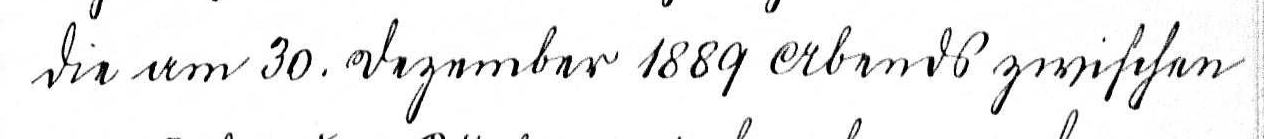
die am 30. Dezember 1889 Abends zwischen
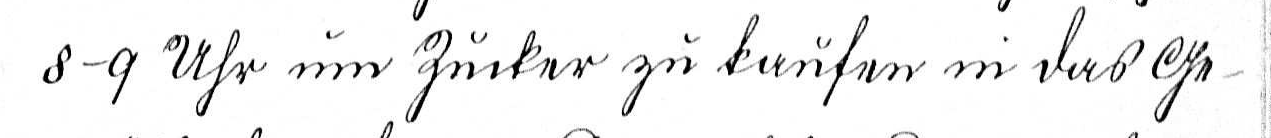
8-9 Uhr um Zucker zu kaufen in das Ge¬
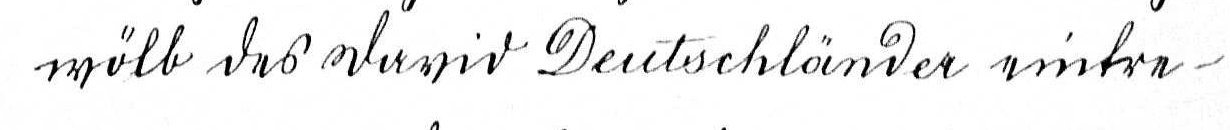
wölb des David Deutschländer eintre¬
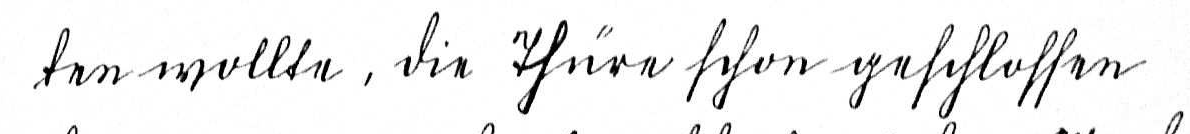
ten wollte, die Thüre schon geschlossen
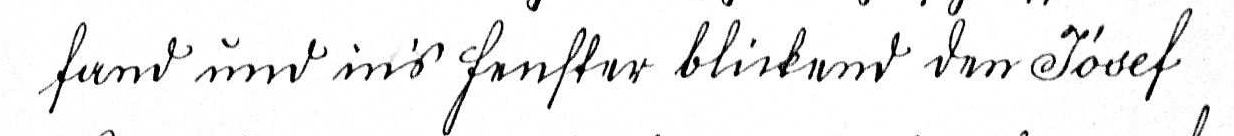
fand und ins Fenster blickend den Jósef
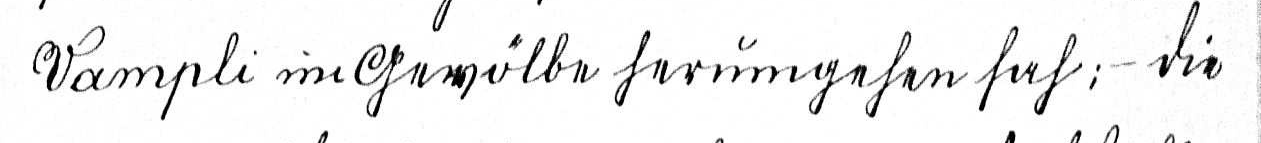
Vampli im Gewölbe herumgehen sah; – die
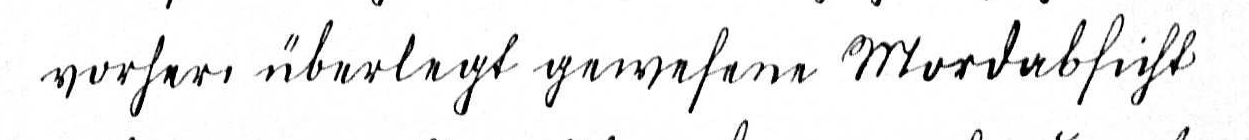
vorher überlegt gewesene Mordabsicht
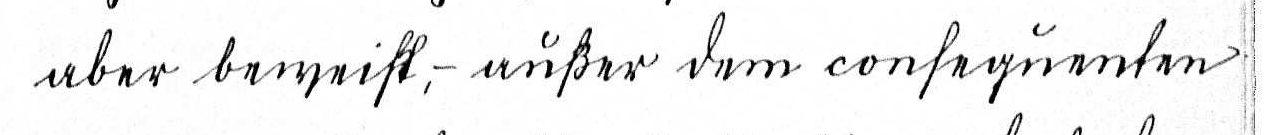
aber beweist, – außer dem consequenten
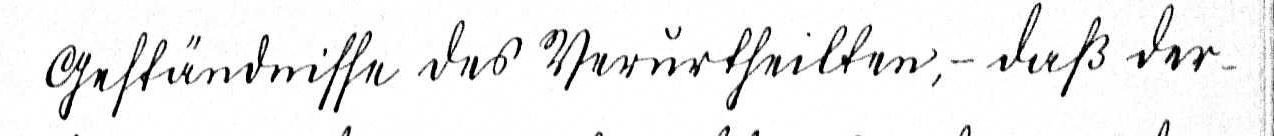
Geständnisse des Verurtheilten, – daß der¬
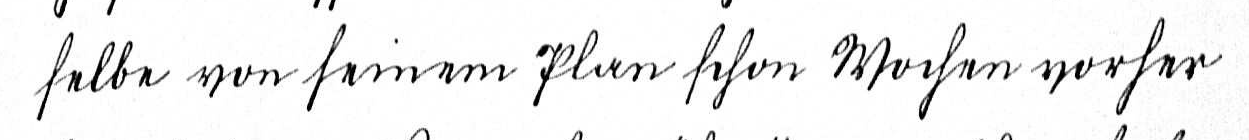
selbe von seinem Plan schon Wochen vorher
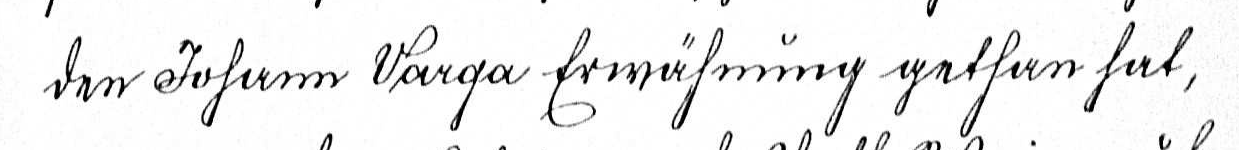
den Johann Varga Erwähnung gethan hat,
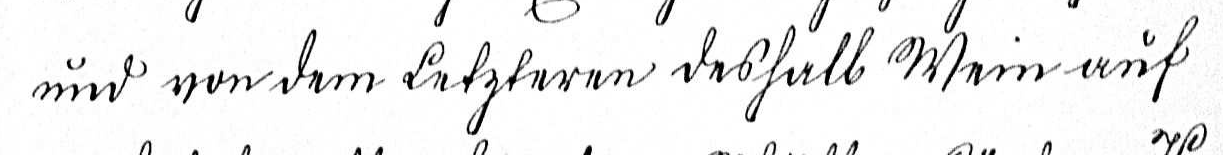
und von dem Letzteren deshalb Wein auf
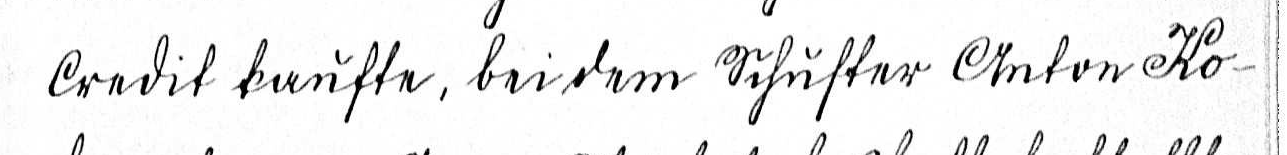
Credit kaufte, bei dem Schuster Anton Ko¬
